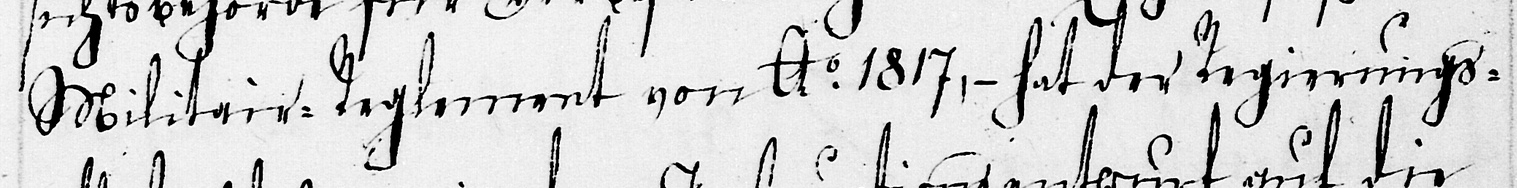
Militair-Reglement von Ao. 1817, – hat der Regierungs¬
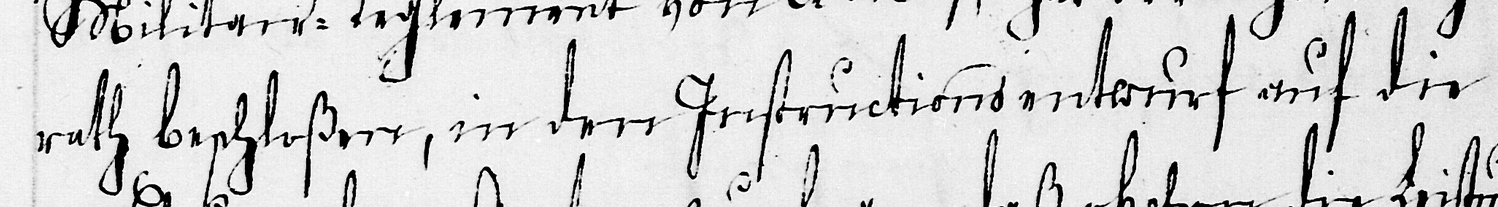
rath beschloßen, in den Instructionsentwurf auf die
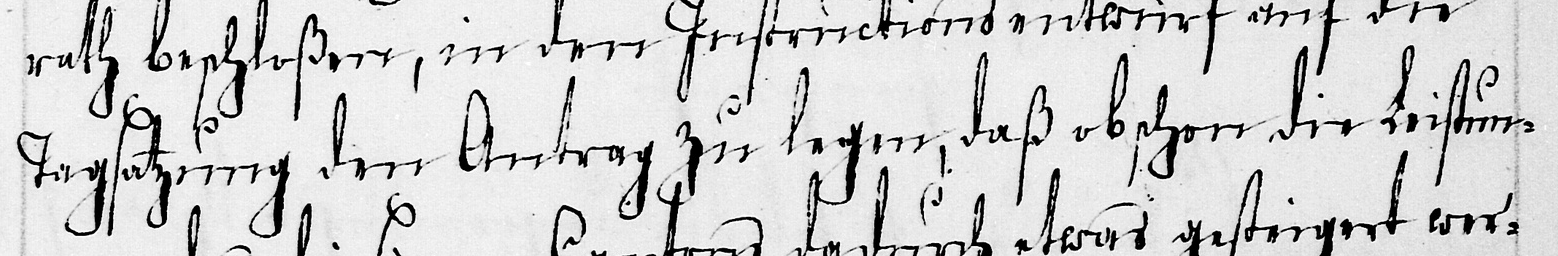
Tagsatzung den Antrag zu legen, daß obschon die Leistun¬
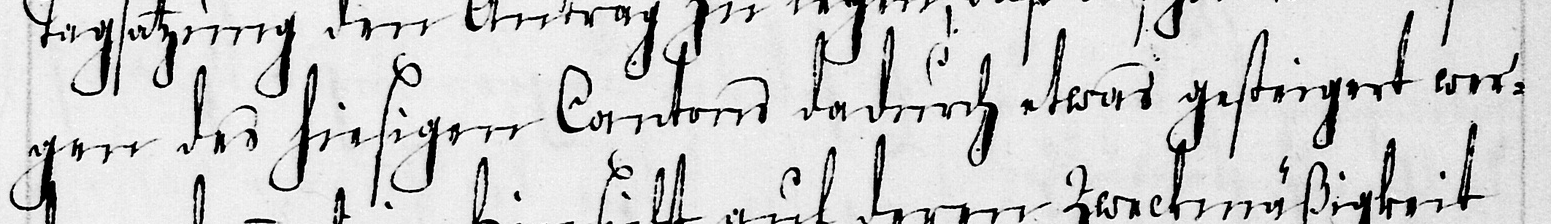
gen des hiesigen Cantons dadurch etwas gesteigert wer¬
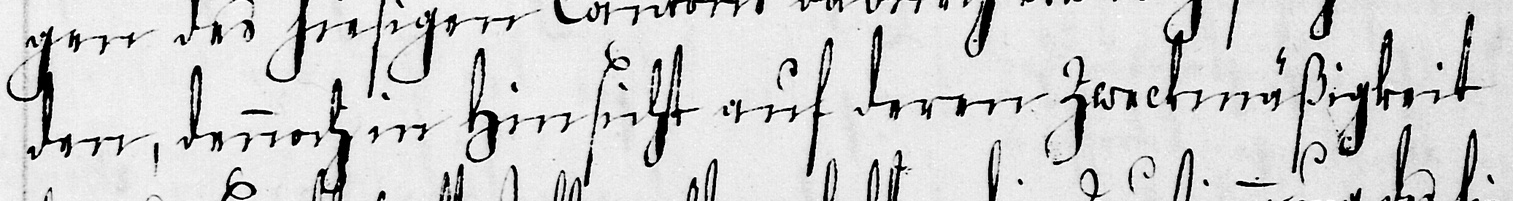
den, dennoch in Hinsicht auf deren Zweckmäßigkeit
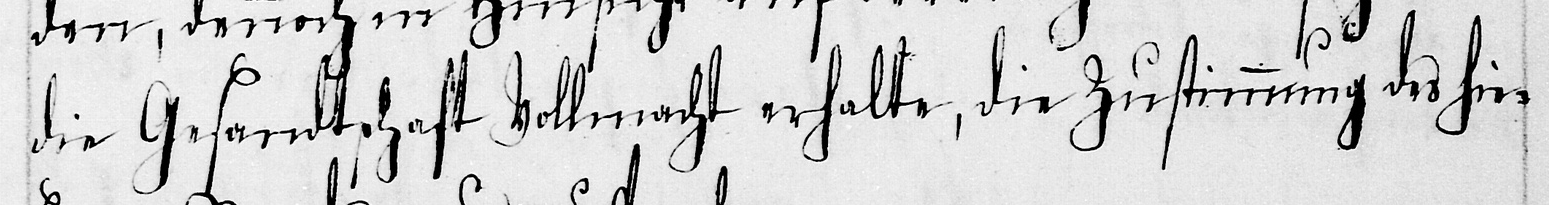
die Gesandtschaft Vollmacht erhalte, die Zustimmung des hie¬
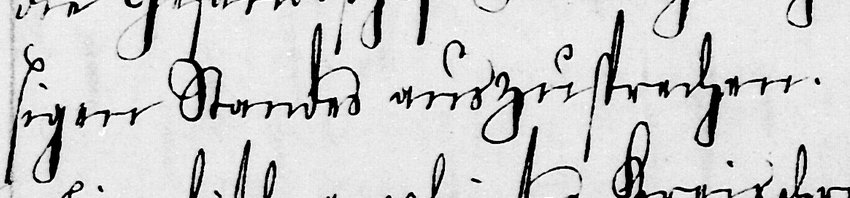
sigen Standes auszusprechen.
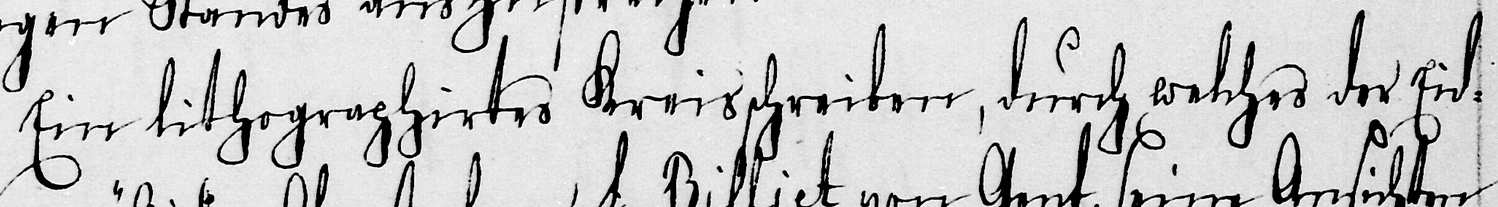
Ein lithographirtes Kreisschreiben, durch welches der Eid¬
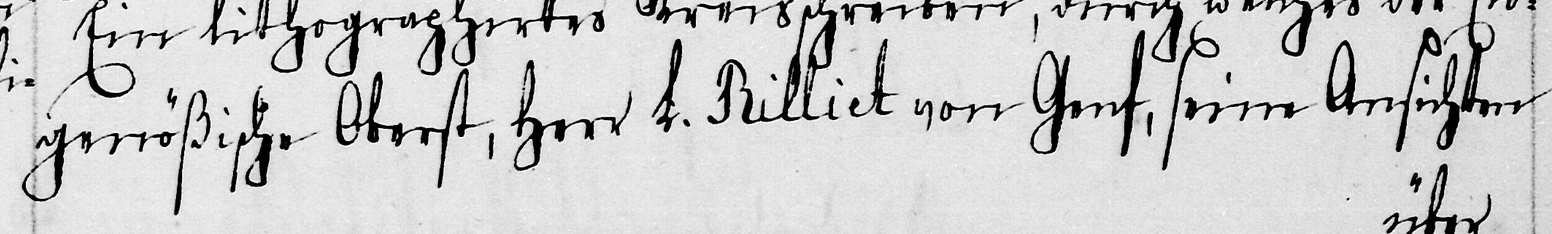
genößische Oberst, Herr L. Rilliet von Genf, seine Ansichten
